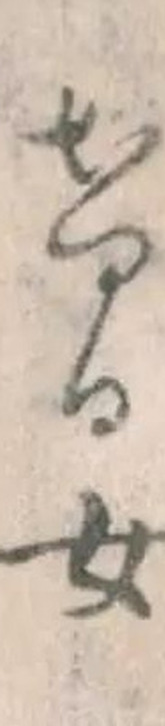ける女
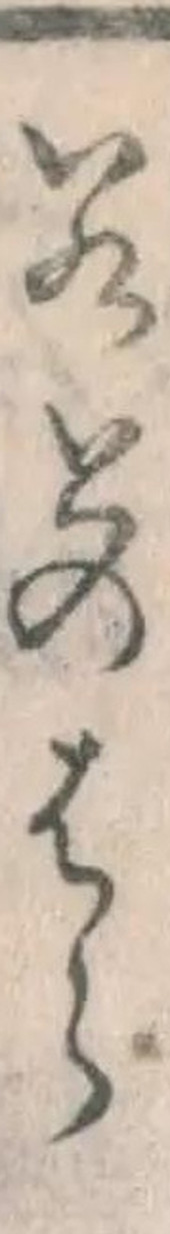若とのはら
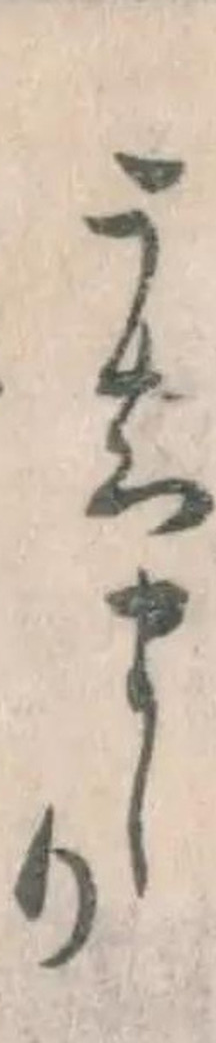うちましり
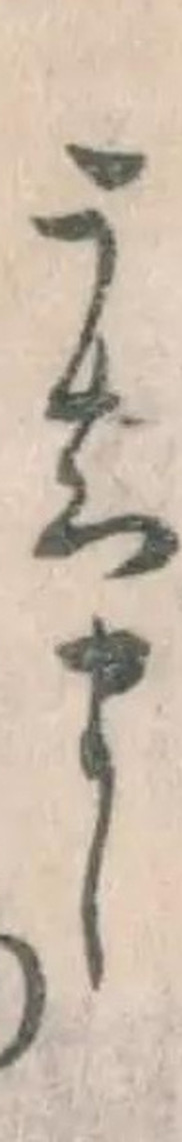うちましり
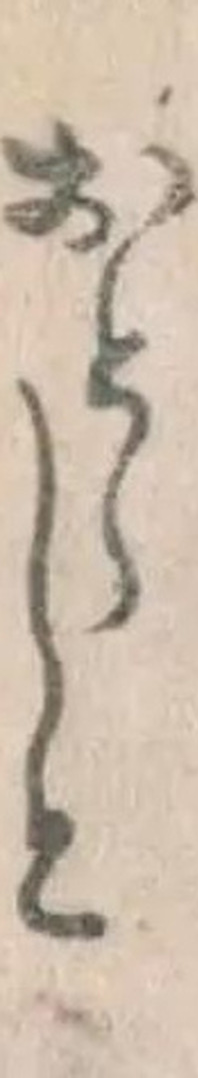おとらしと
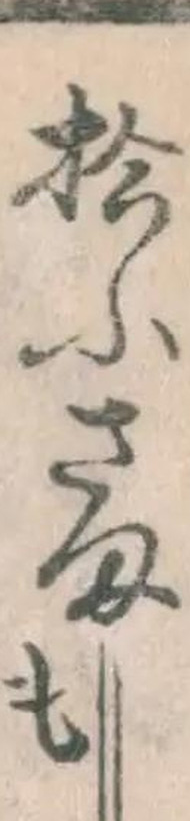拾ふさまも
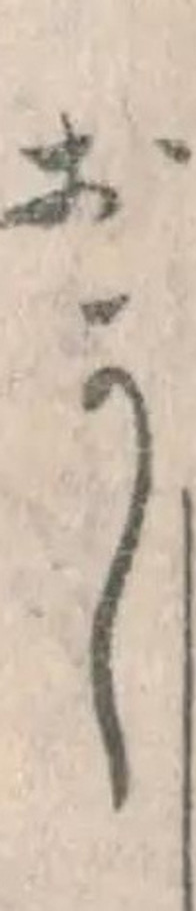おかし
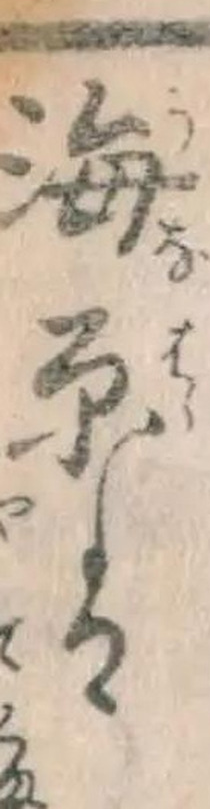海原は
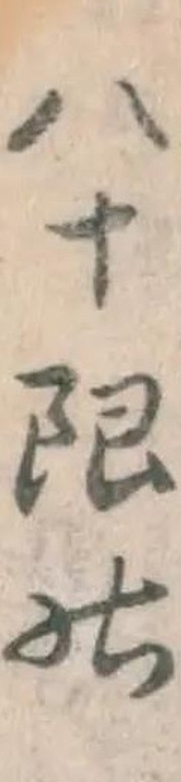八十限の
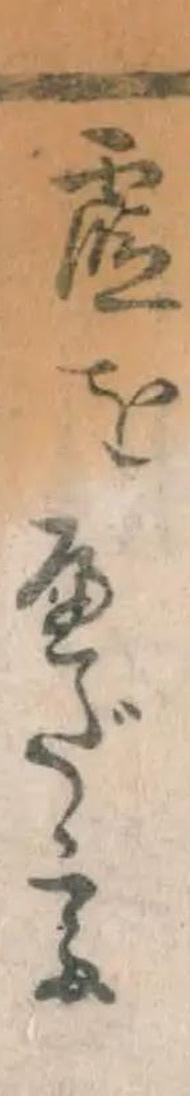霞をへだて
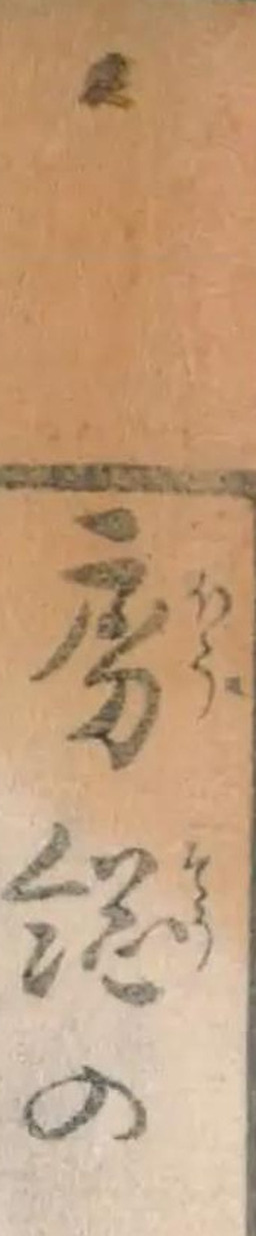房総の
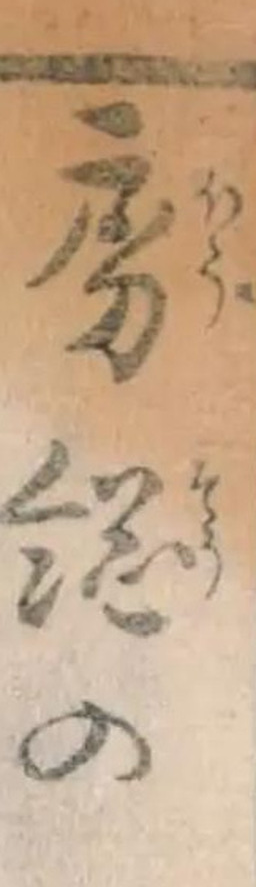房総の
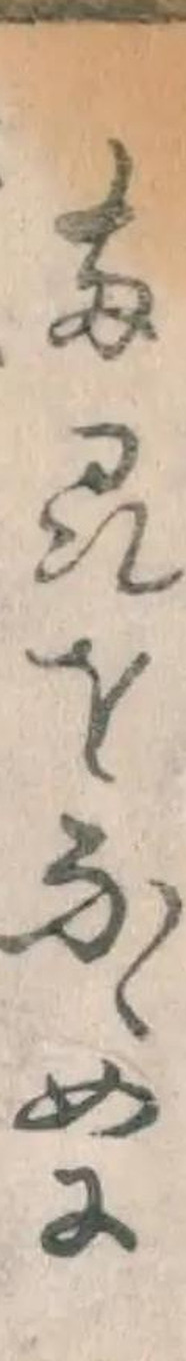両州をなゝめに
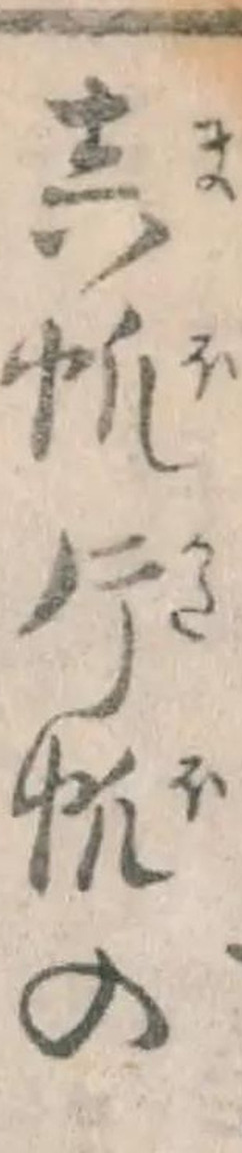真帆片帆の
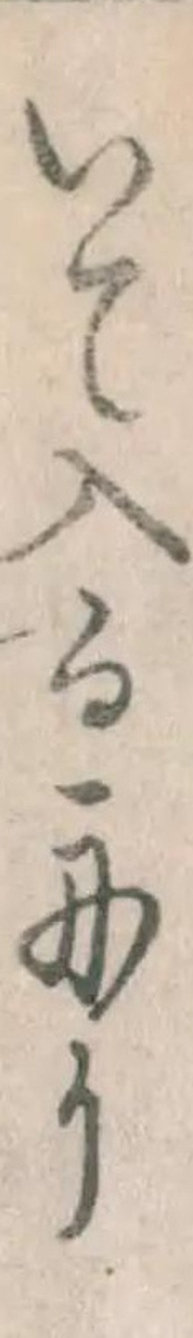いて入る舟に
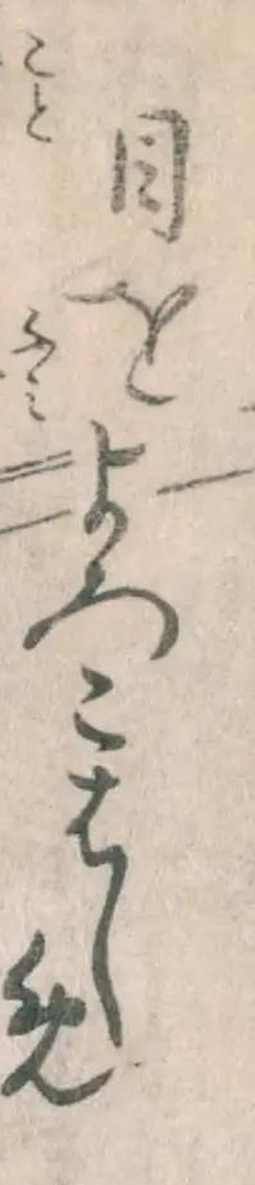目をよろこはしめ
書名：絵本物見岡
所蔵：国立国会図書館 National Diet Library, JAPAN
